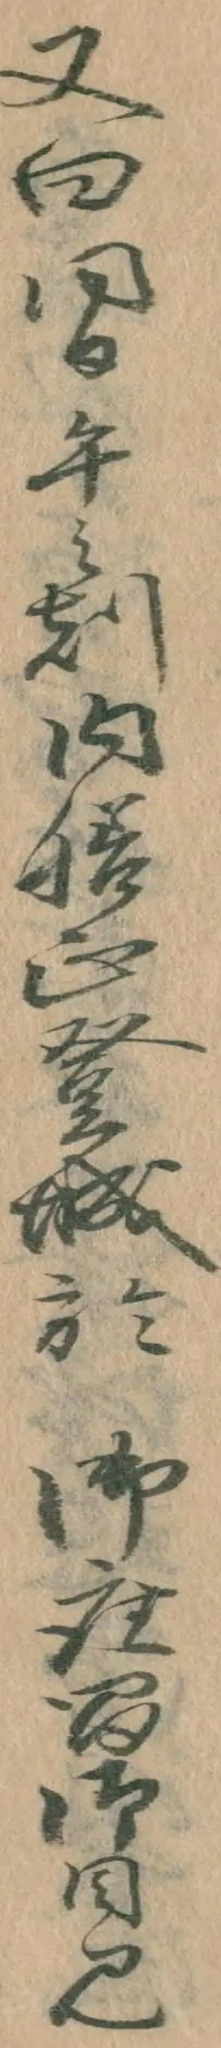又曰同日午之刻内膳正登城於御座間御目見
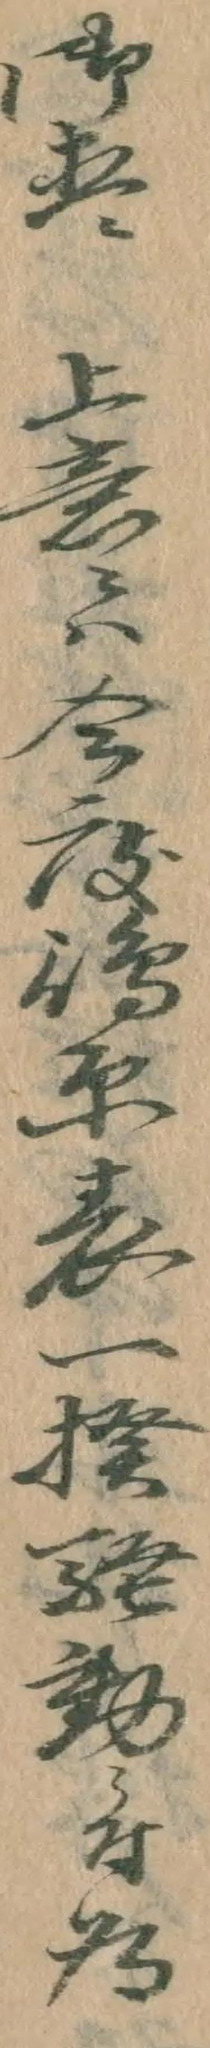御直に上意には今度島原表一揆騒動に付為
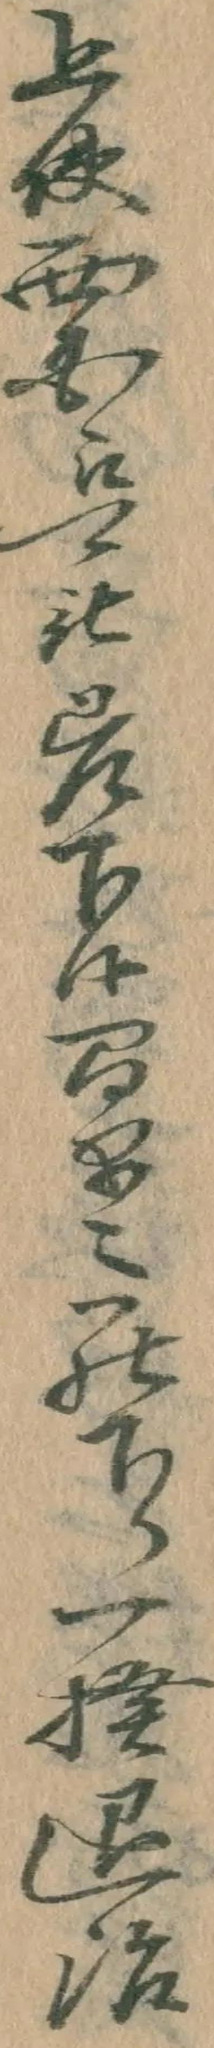上使西国江可被差下候間早々罷下り一揆退治
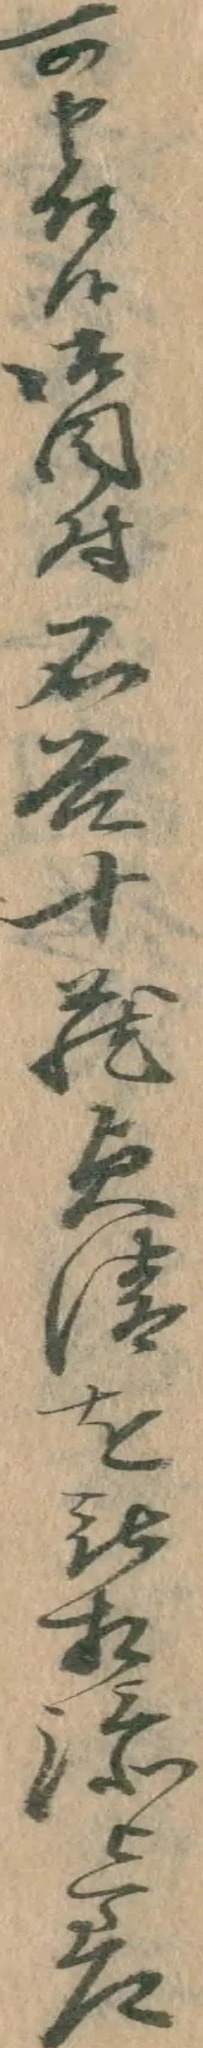可申付候御目付石谷十蔵貞清を被相添迄差
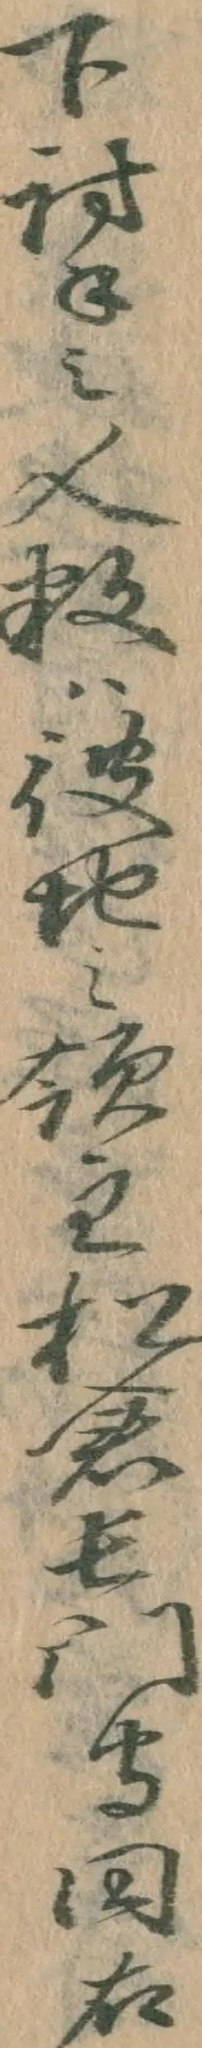下討手之人数は彼地之領主松倉長門守同右
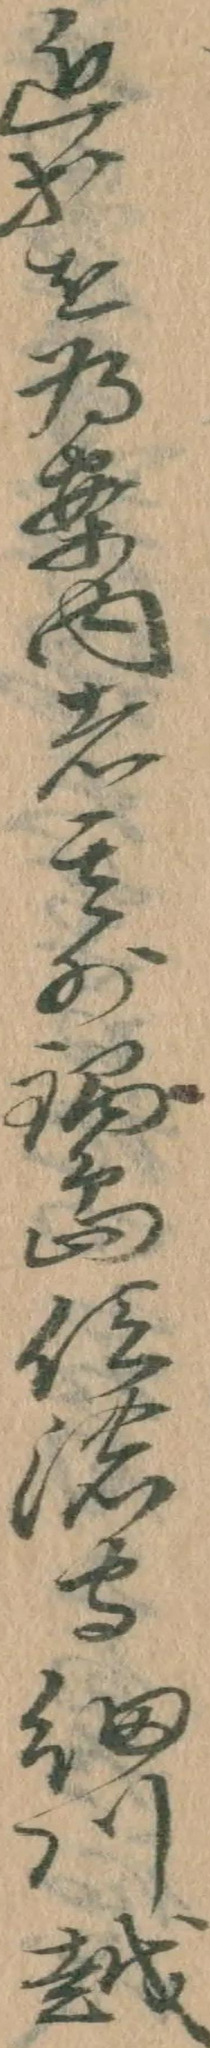近等を為案内者其外鍋島信濃守細川越
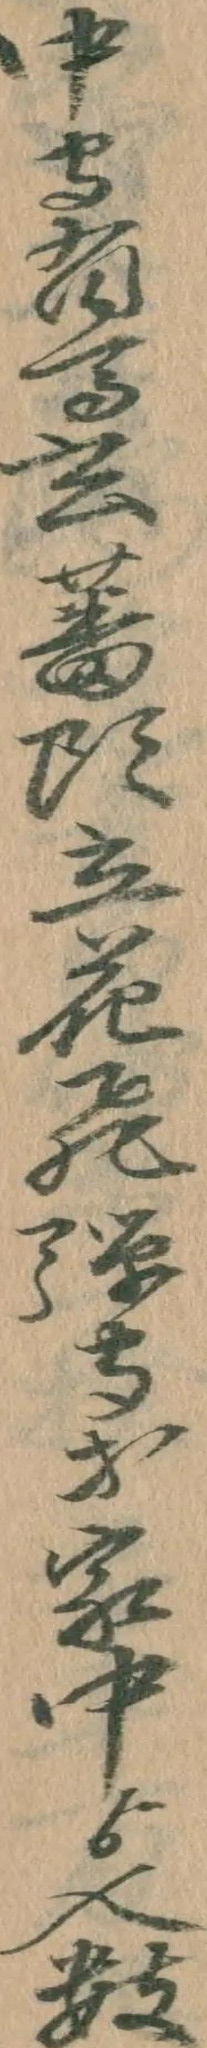中守有馬玄蕃頭立花飛騨守等家中ゟ人数
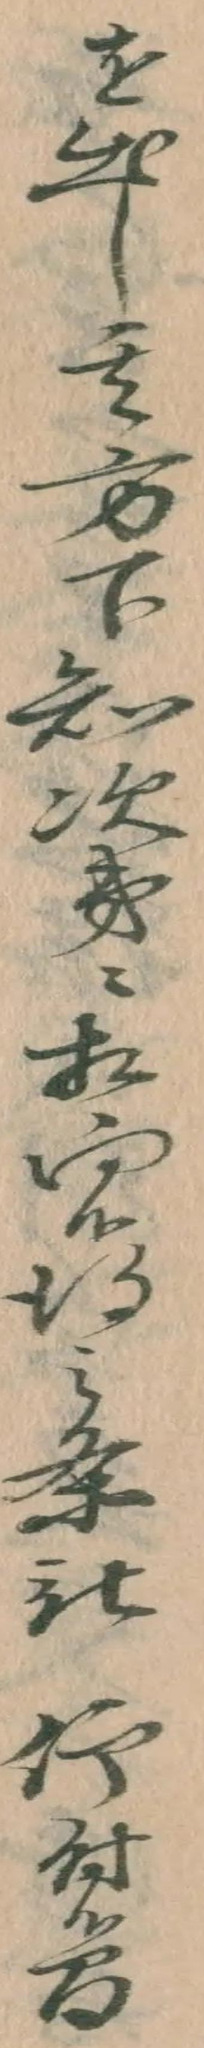を出し其方下知次第に相向候得之条被仰付候間
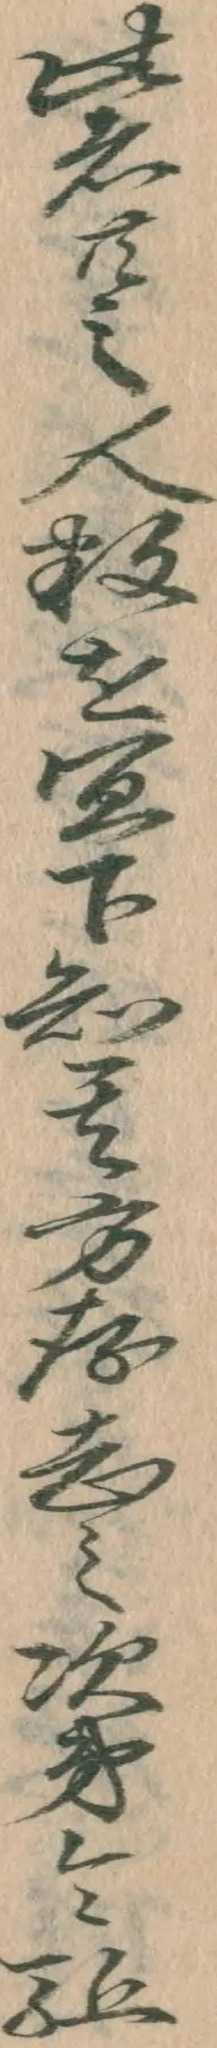此者共之人数を宜下知其方存者之次第令馳
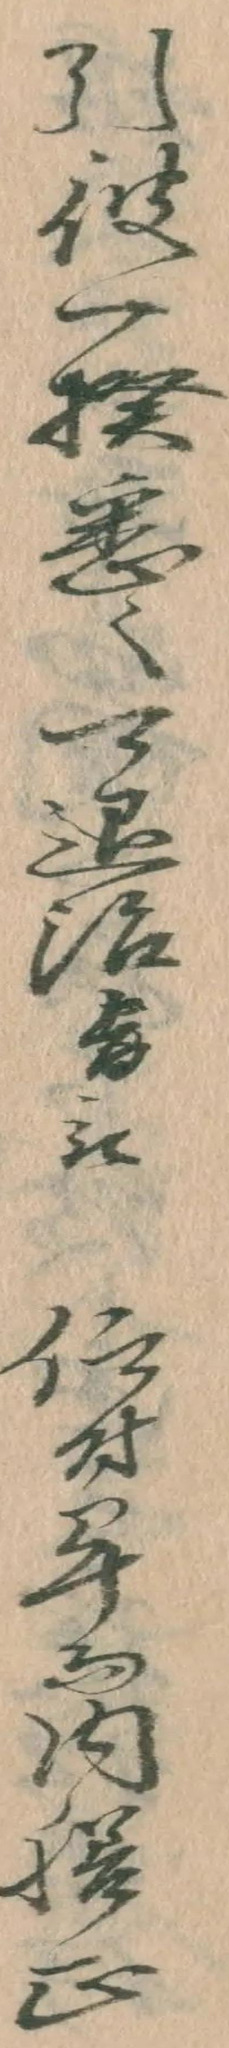引彼一揆悉く可退治旨被仰付畢而内膳正
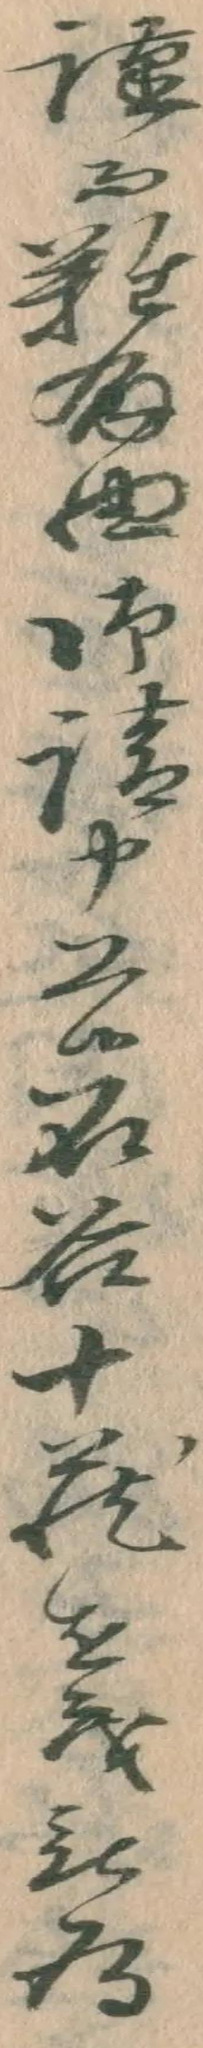謹而難有由御請申上候石谷十蔵を茂被為
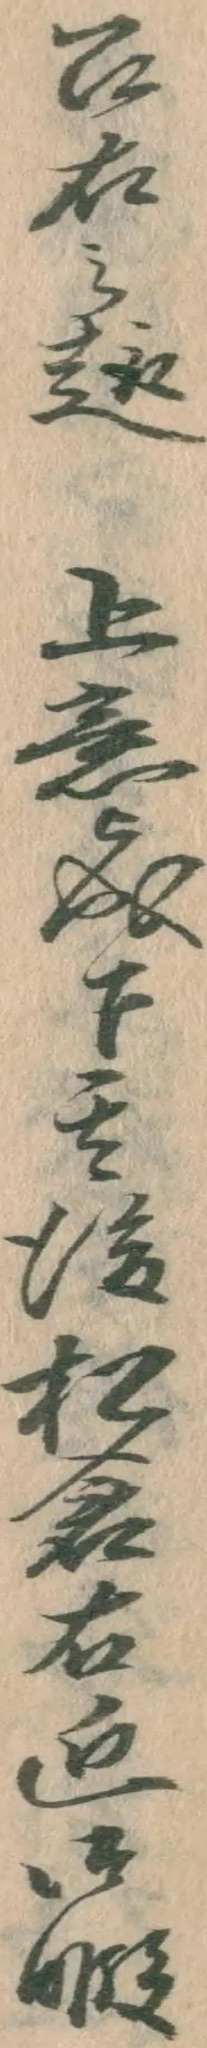召右之趣上意被成下其後松倉右近御暇
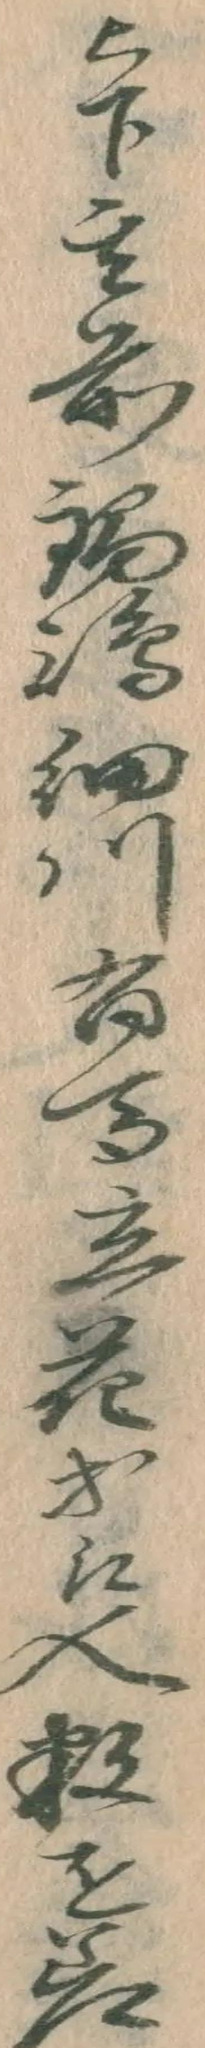被下其前鍋島細川有馬立花等江人数を差
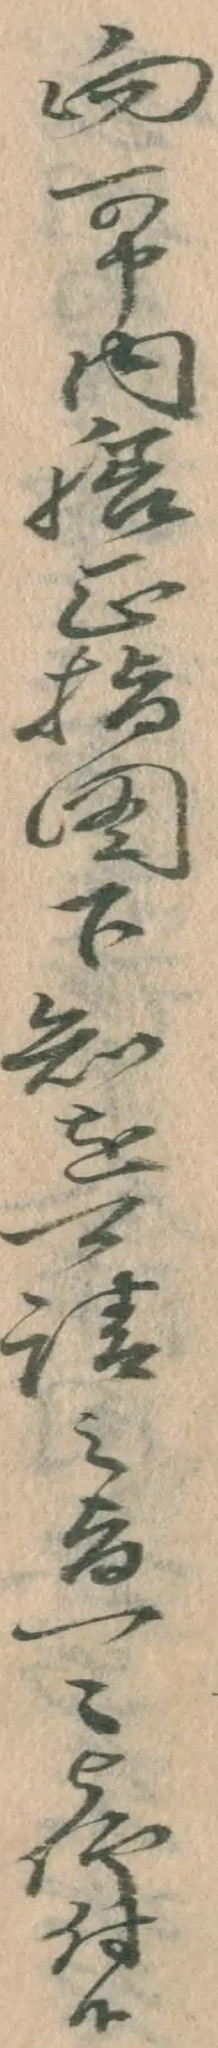向可申内膳正指図下知を可請之旨一々被仰付候
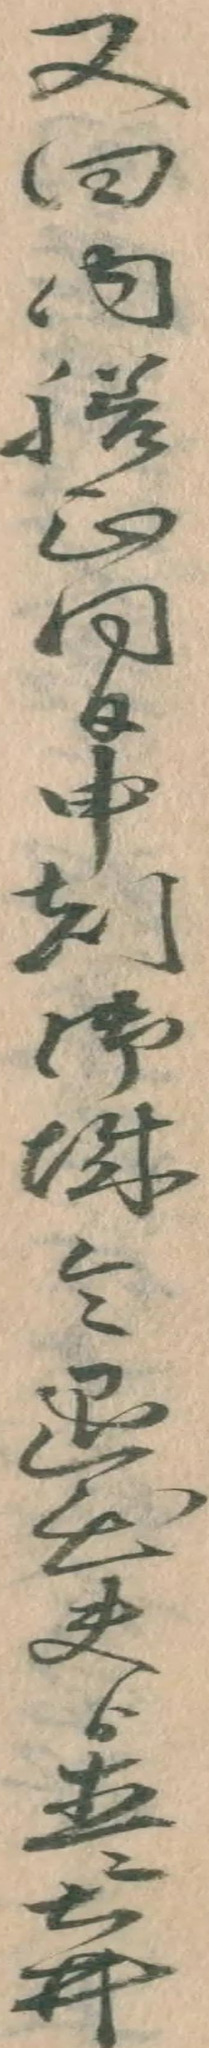又曰内膳正同日申刻御城令退出夫ゟ直に土井
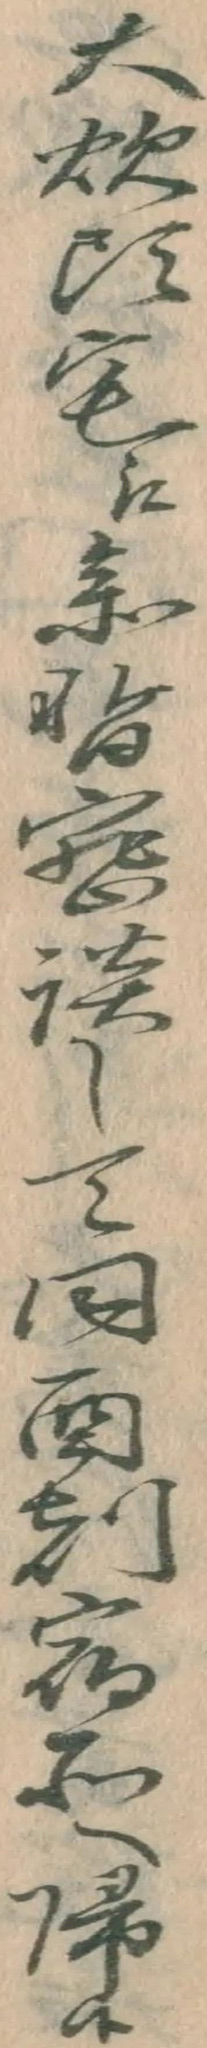大炊頭宅江参暫密談して同酉刻宿所へ帰候
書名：切支丹御退治記 49巻. [2]
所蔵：国立国会図書館 National Diet Library, JAPAN
